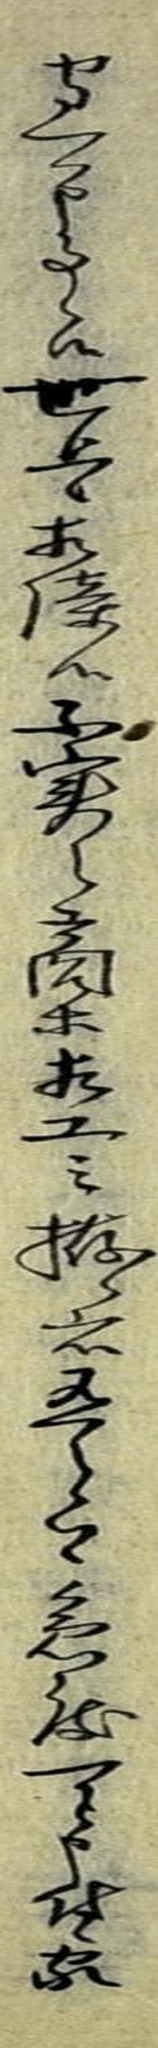守可申事に候世上へ相障候不実之商等相工み拵候者有之候はゝ急度可被申付候家
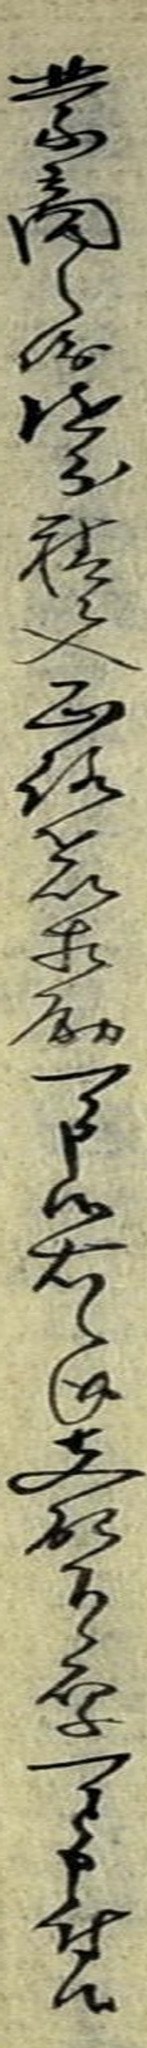業商之儀随分精に入正路を以相励可申候右之趣支配下へ厚可被申付候
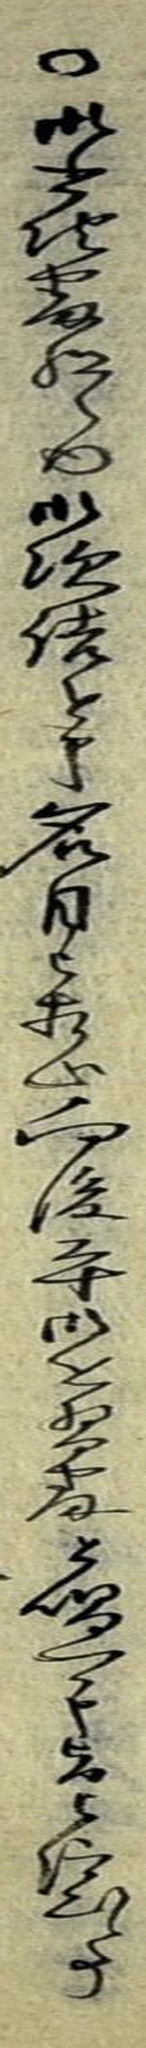〇御書院番組之内御次詰と申名目被相止向後平御近習番と唱可申旨被仰出候事
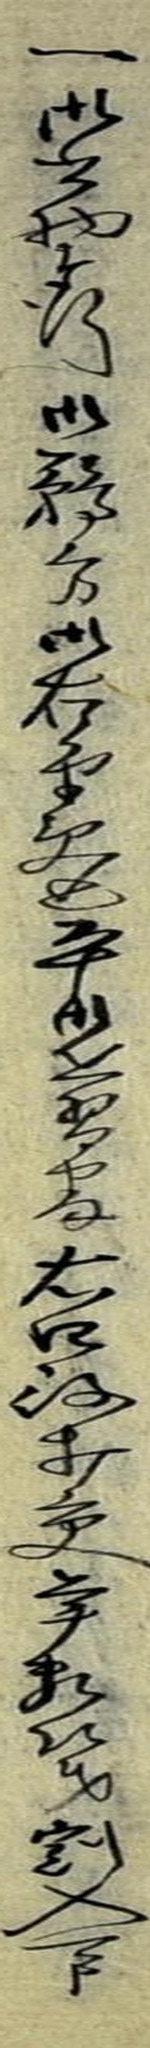一御書物奉行御鵜方御右筆受込平御近習番右四役打交年数次第割入可申
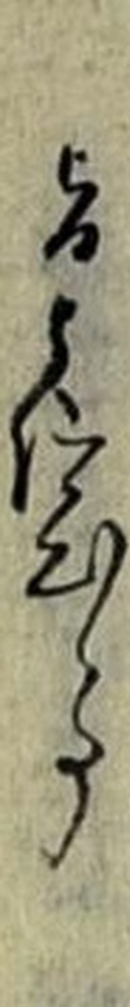旨被仰出候事
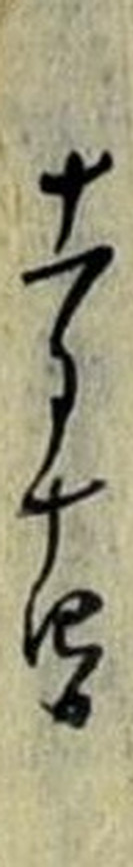十一月十四日
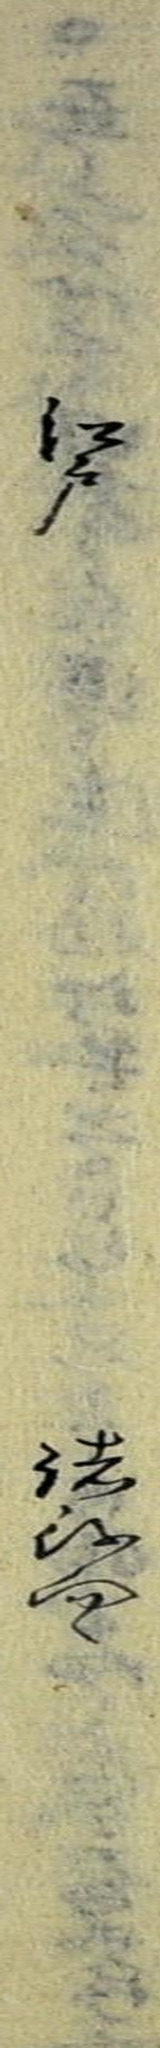江戸諸役向へ
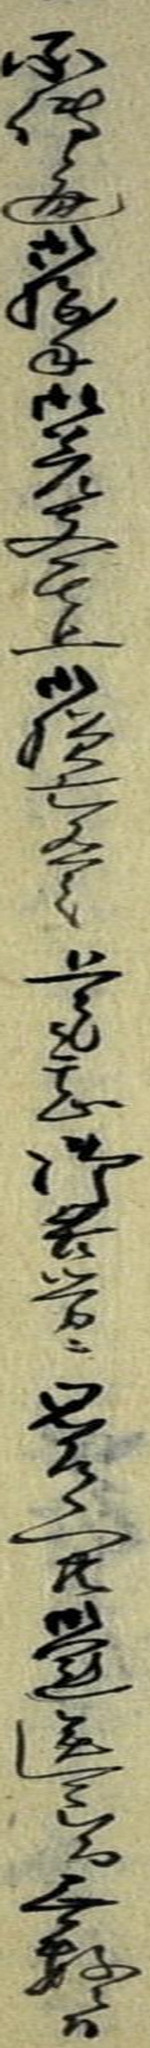〇承伝候通御勝手御差支其上御損亡有之上にも甚御苦労に思召候へ共御運送至而無数に付
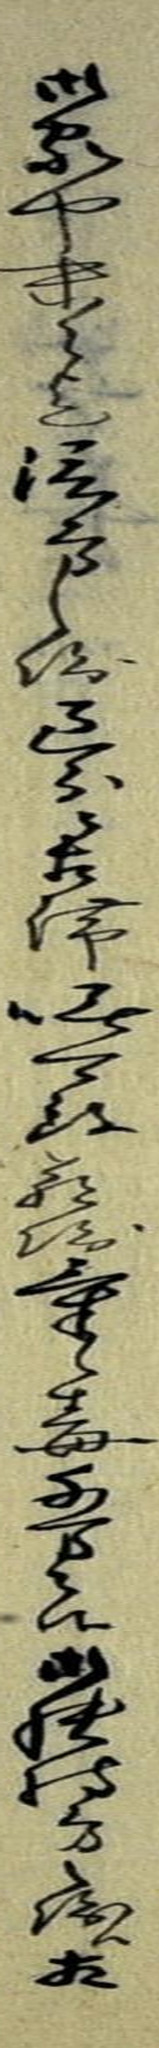御家中末々迄渡方之儀過分に相滞可致難儀気之毒千万に候御扶持方之儀は相
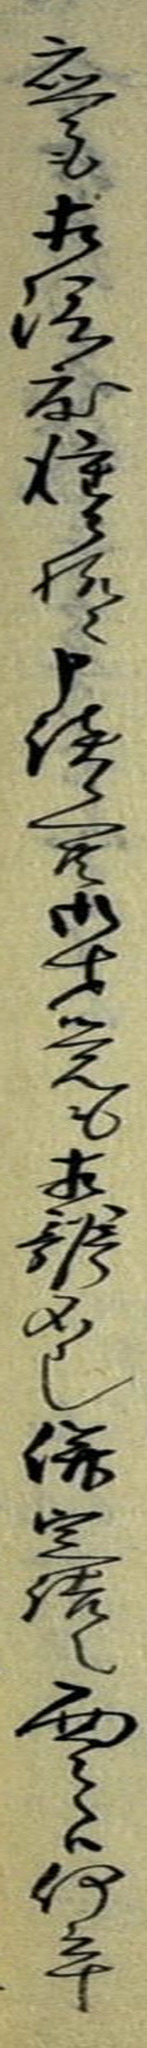応にも相渡度種々様々申談候へ共御才覚も相弁不申候併定詰之面々は何卒
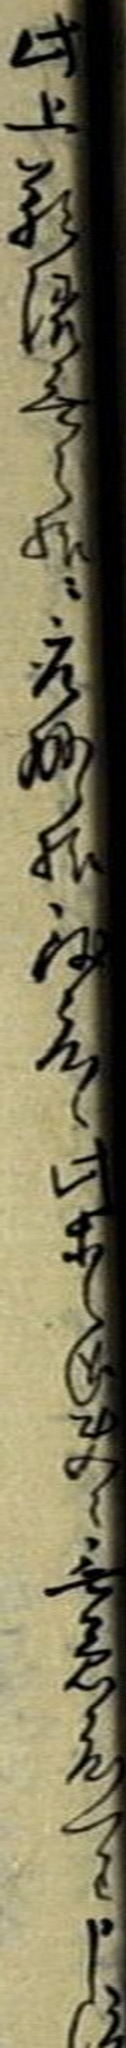此上難渋無之様に取扱候様致度候此等之趣夫々無急度可被申渡候
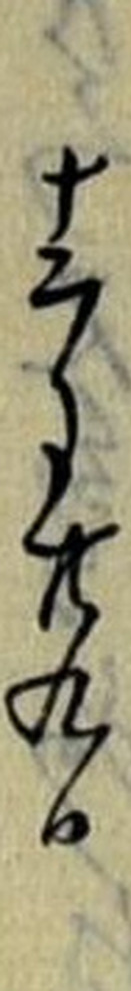十二月廿九日
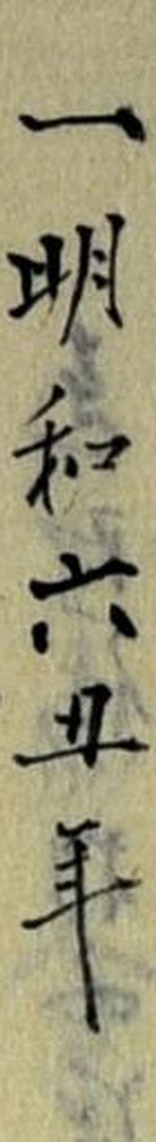一明和六丑年
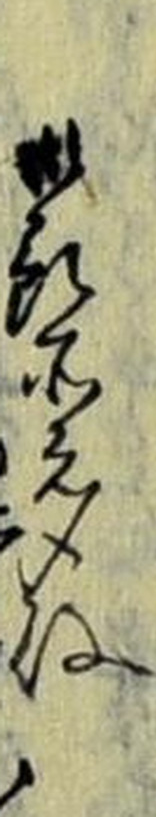御預所元〆役
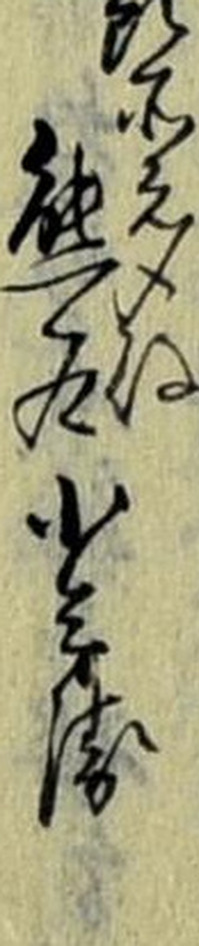熊谷小兵衛
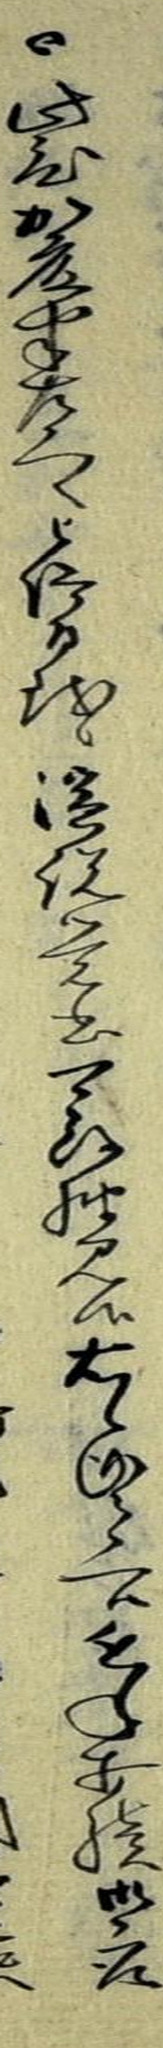〇此度加藤半左衛門へ被仰付越候演説覚書可致披見候右之趣に候へは近年打続御取
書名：命令之部 二
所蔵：福井県文書館 Fukui Prefectural Archives
